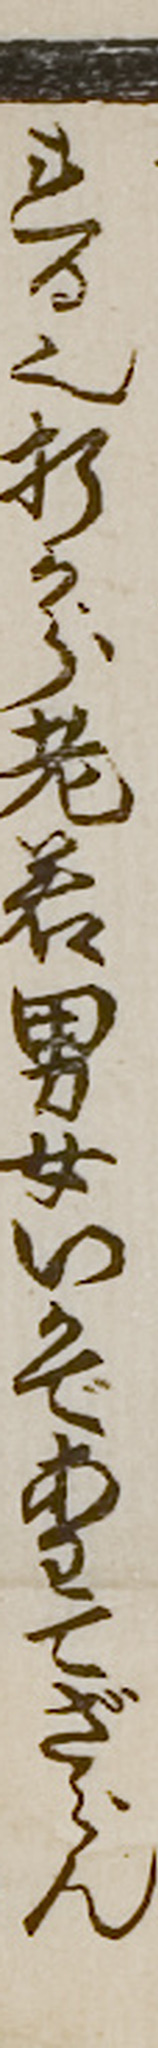れる也折から老若男女いかであわてざらん
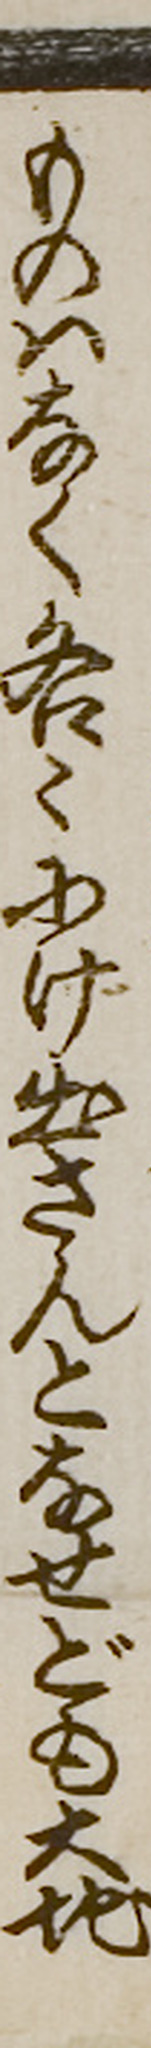ものはなく各々にげ出さんとなせども大地
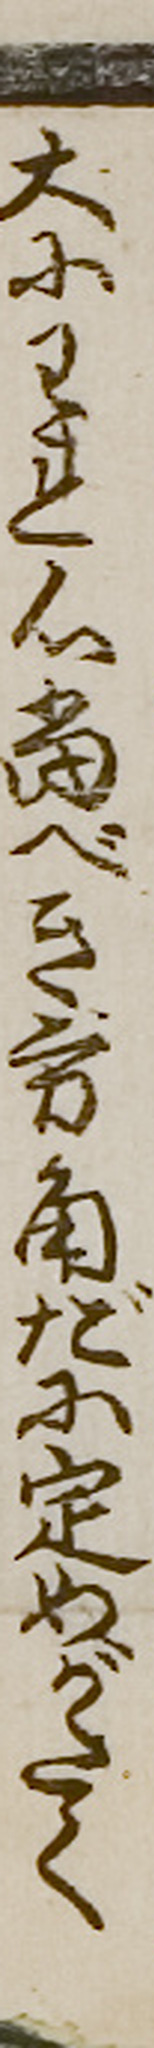大にわれ心当べき方角だに定めがたく
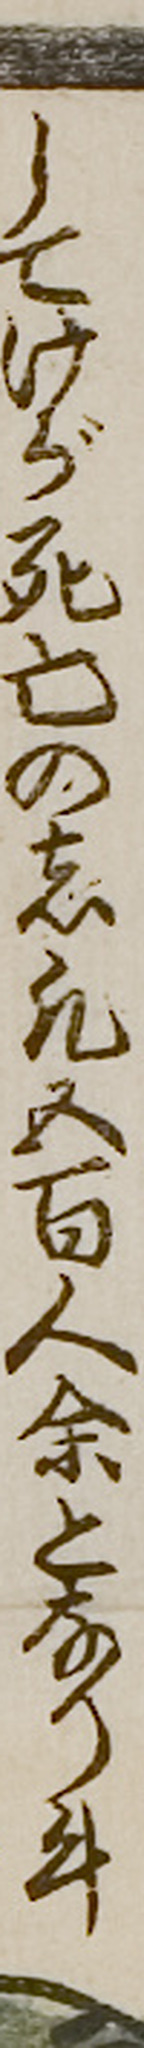してけが死亡の者凡五百人余となり牛
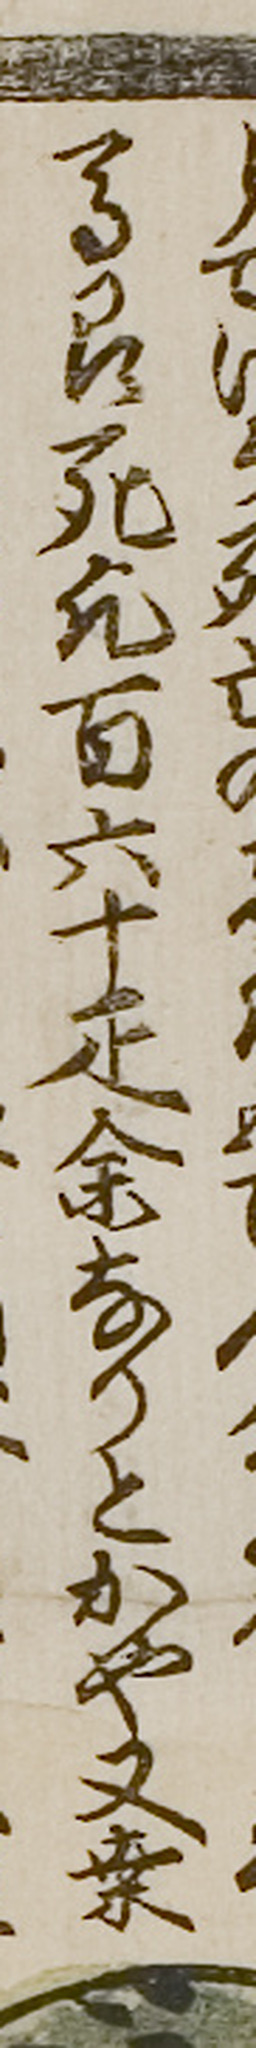馬即死凡百六十疋余なりとかや又桑
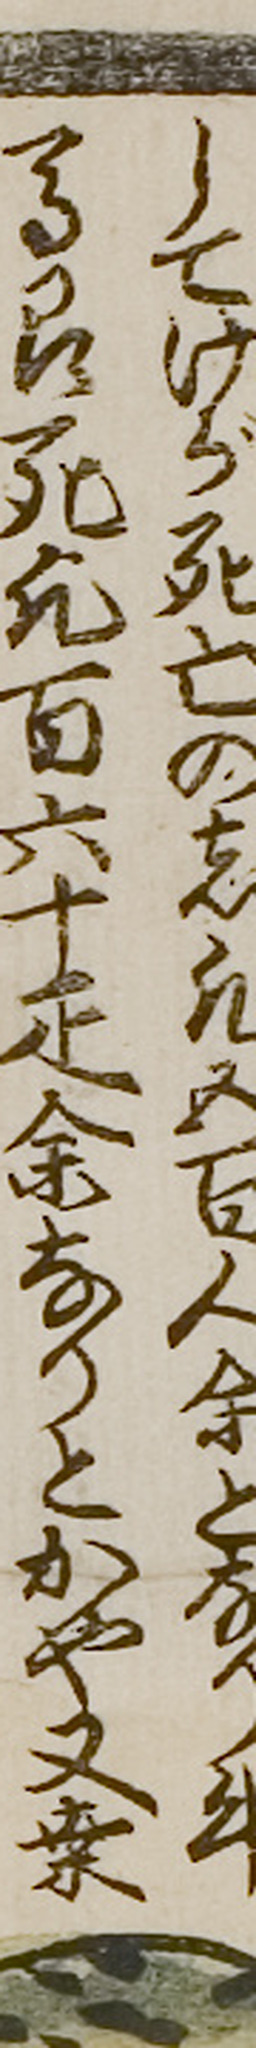馬即死凡百六十疋余なりとかや又桑
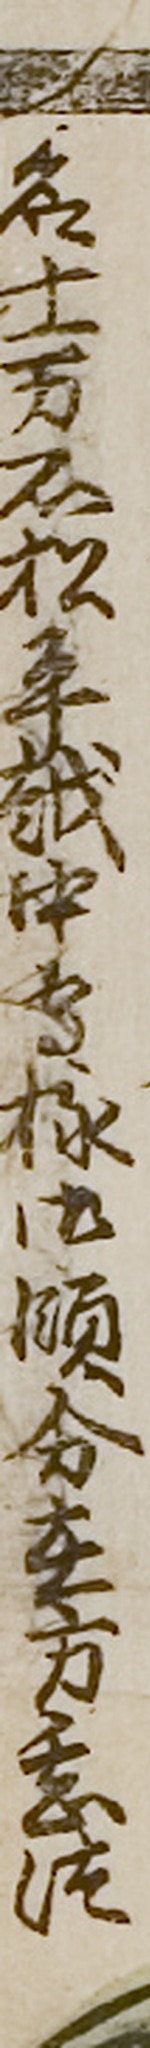名十一万石松平越中守様御領分在方甚つ
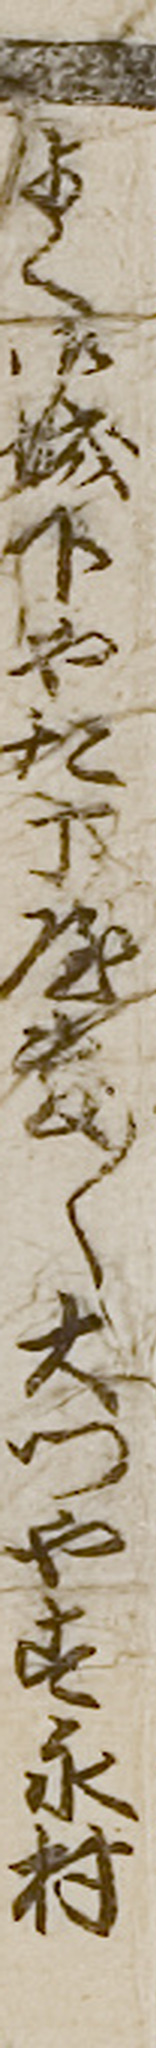よく御城下やた丁家敷〳〵大門やす永村
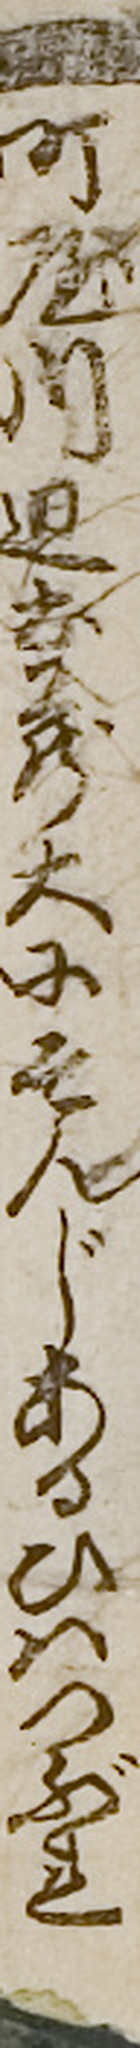町屋川辺土蔵大にそんじあるひはつぶれ
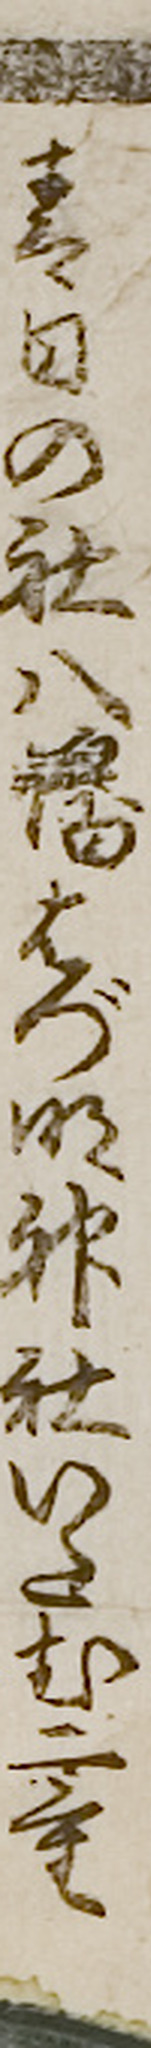春日の社八幡はづ明神社いたむ二重
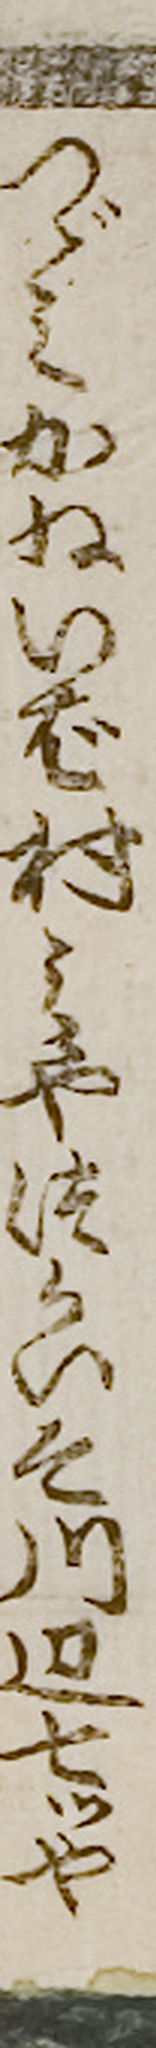つゞみかねいば村みやつかいそ川辺七つや
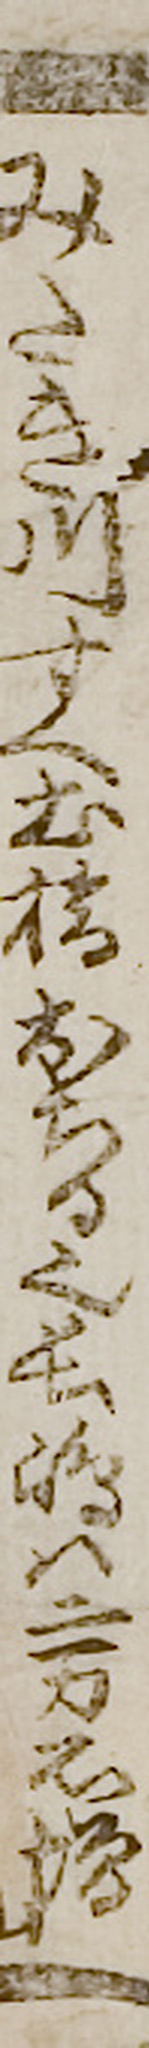みたき川すへ土橋おちる也長嶋は二万石増山
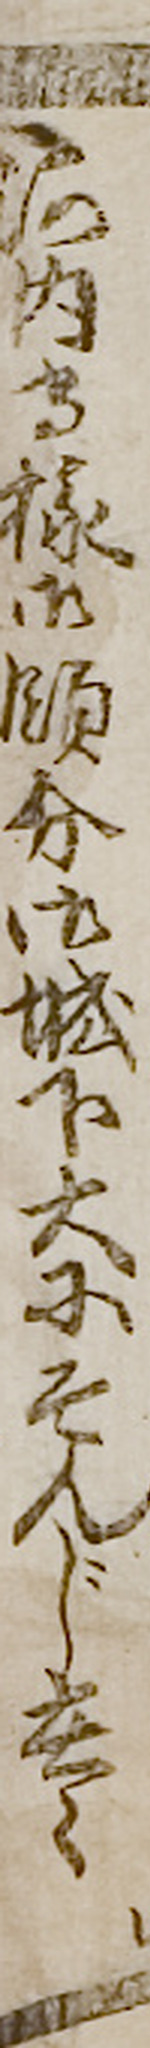河内守様御領分御城下大にそんじ在々
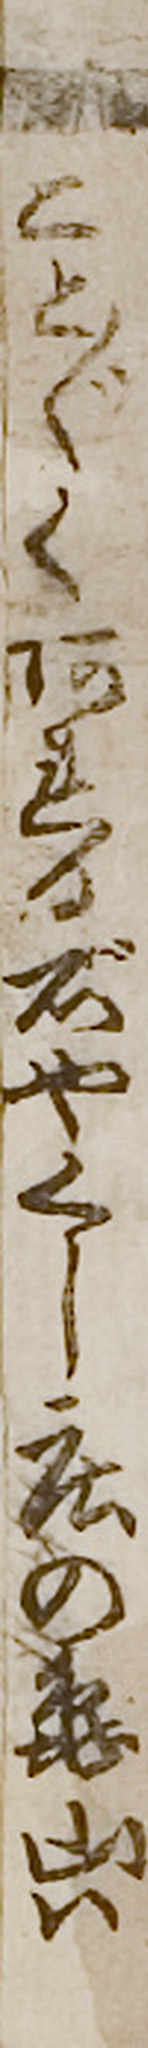こと〳〵ぐあれる石やくし庄の亀山は
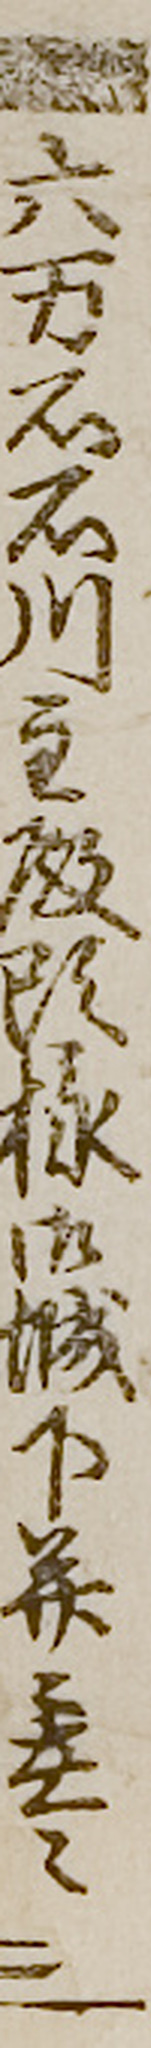六万石石川主殿頭様御城下并に在々
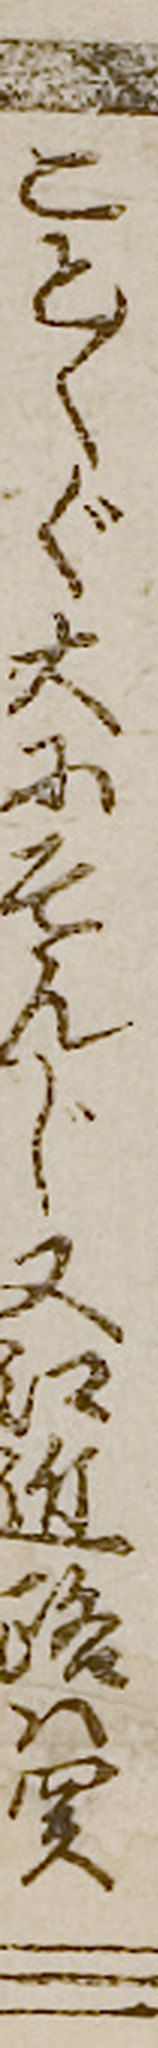こと〴〵く大にそんじ又近江路は関
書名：伊勢伊賀志摩近江尾張美濃大地震の図
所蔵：東京大学総合図書館 General Library in the University of Tokyo, JAPAN
